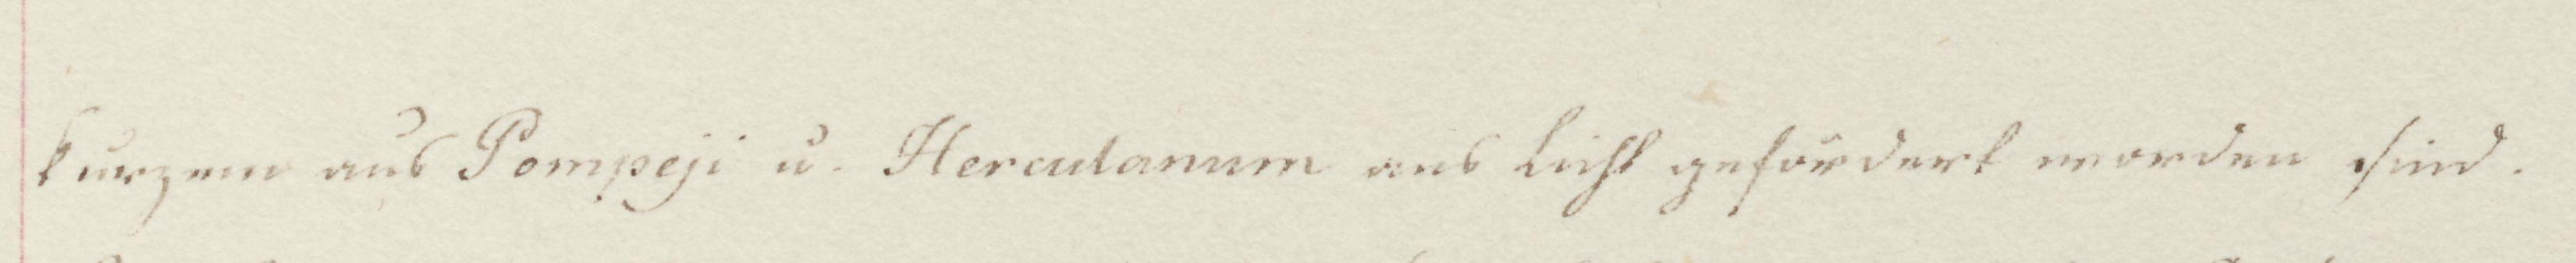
kurzem aus Pompeji u. Herculanum ans Licht gefördert worden sind.
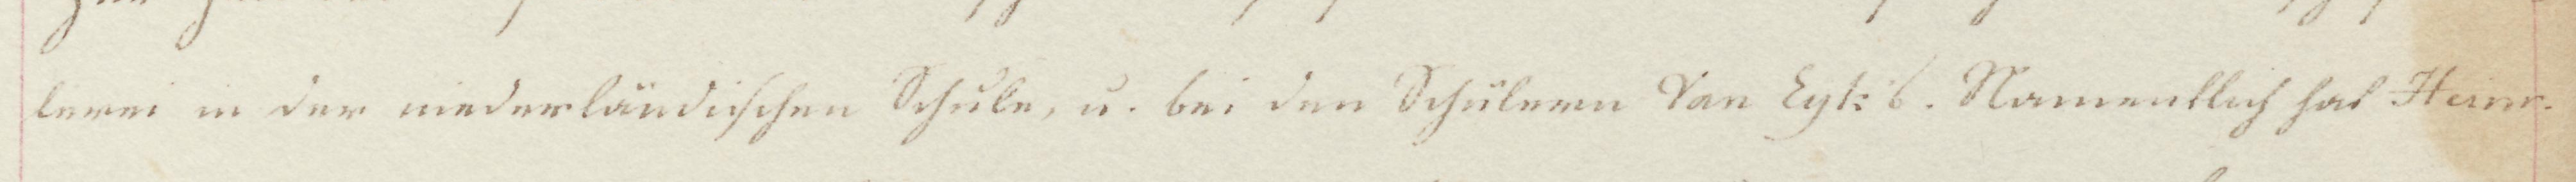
lerei in der niederländischen Schule, u. bei den Schülern Van Eyk's. Namentlich hat Heinr.
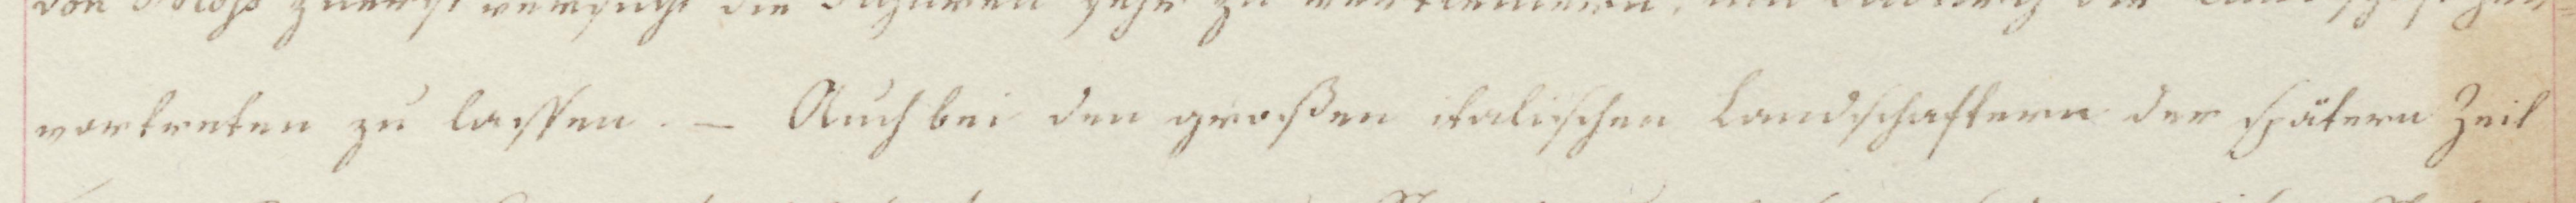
vortreten zu lassen. – Auch bei den großen italischen Landschaftern der spätern Zeit
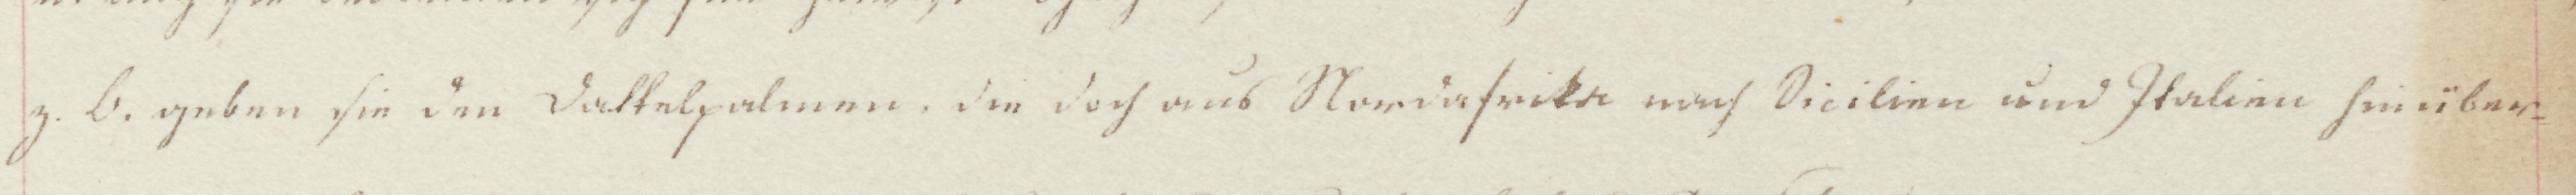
z. B. geben sie den Dattelpalmen, die doch aus Nordafrika nach Sicilien und Italien hinüber-
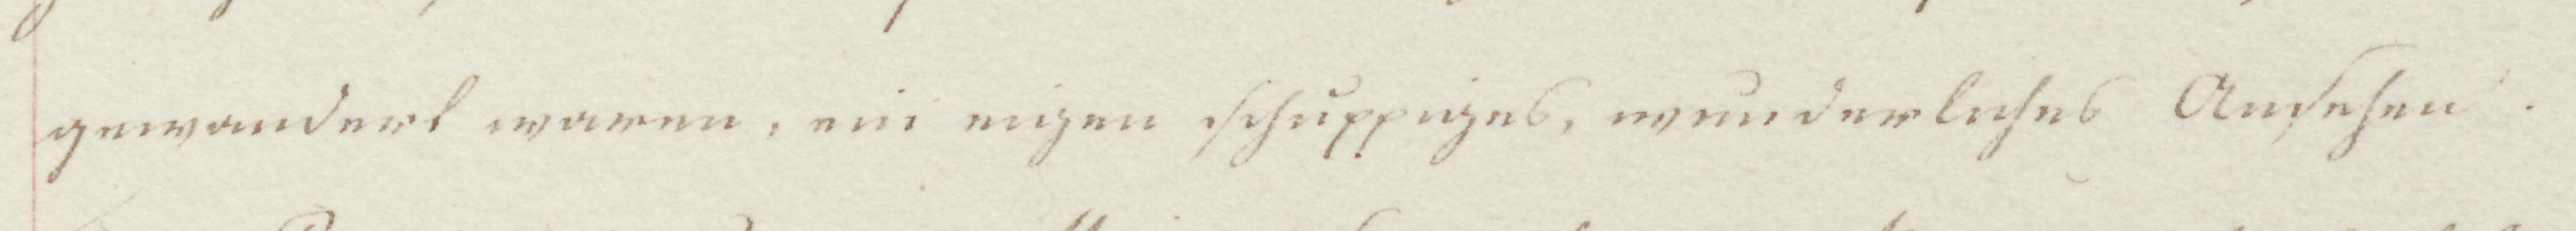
gewandert waren, ein eigen schuppiges, wunderliches Ansehen.
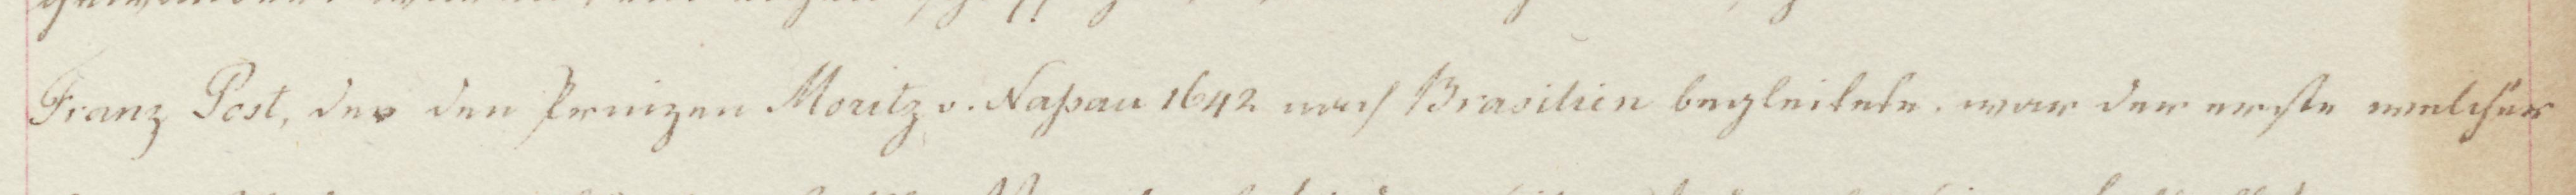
Franz Post, der den Prinzen Moritz v. Nassau 1642 nach Brasilien begleitete, war der erste welcher
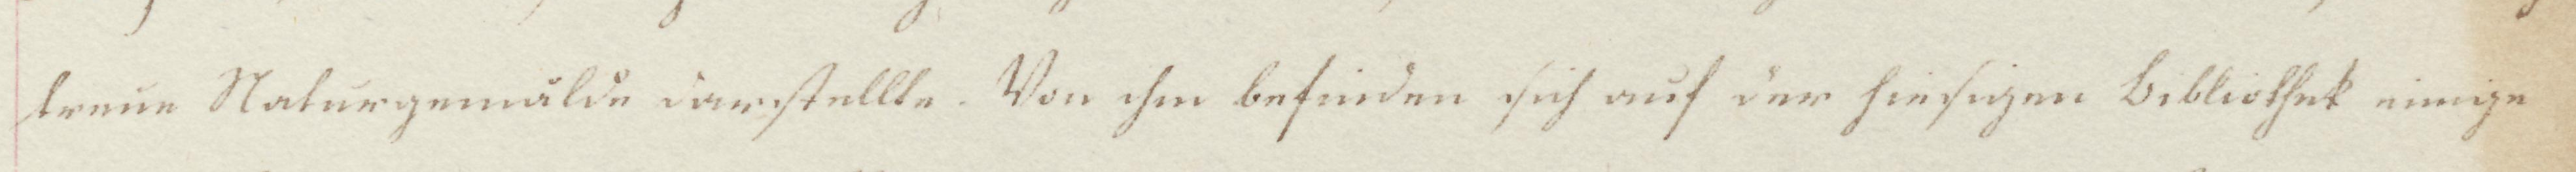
treue Naturgemälde darstellte. Von ihm befinden sich auf der hiesigen Bibliothek einige
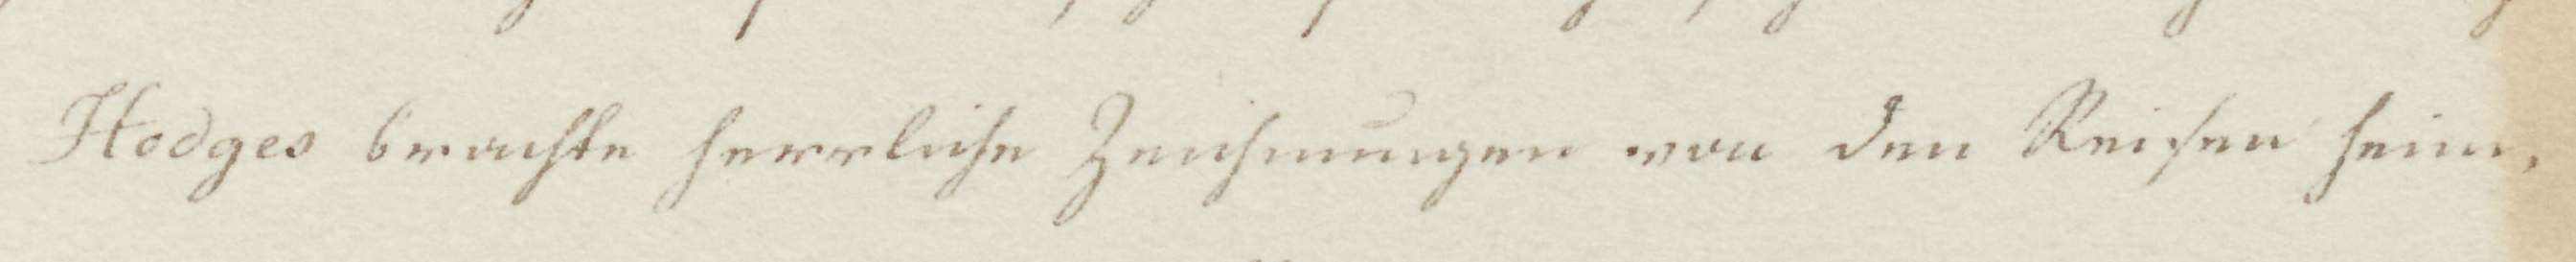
Hodges brachte herrliche Zeichnungen von den Reisen heim,
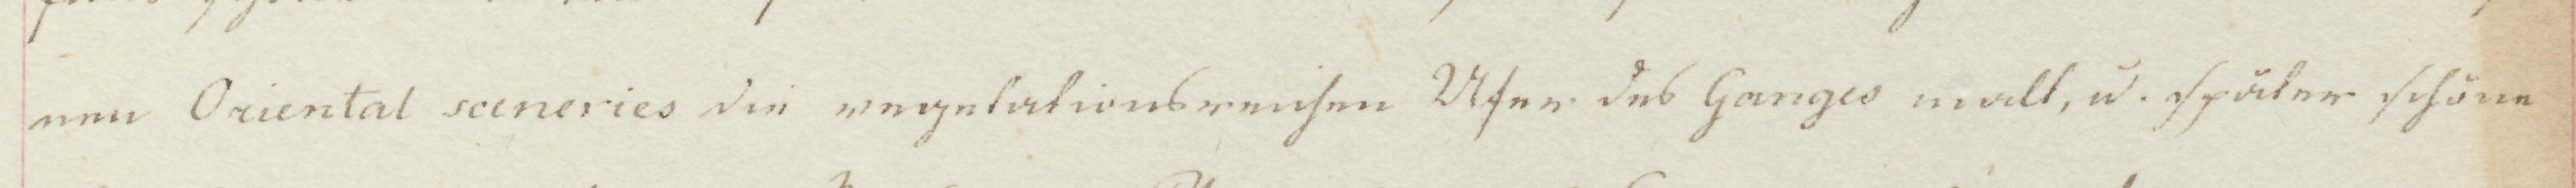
nen Oriental sceneries, die vegetationsreichen Ufer des Ganges malt, u. später schöne
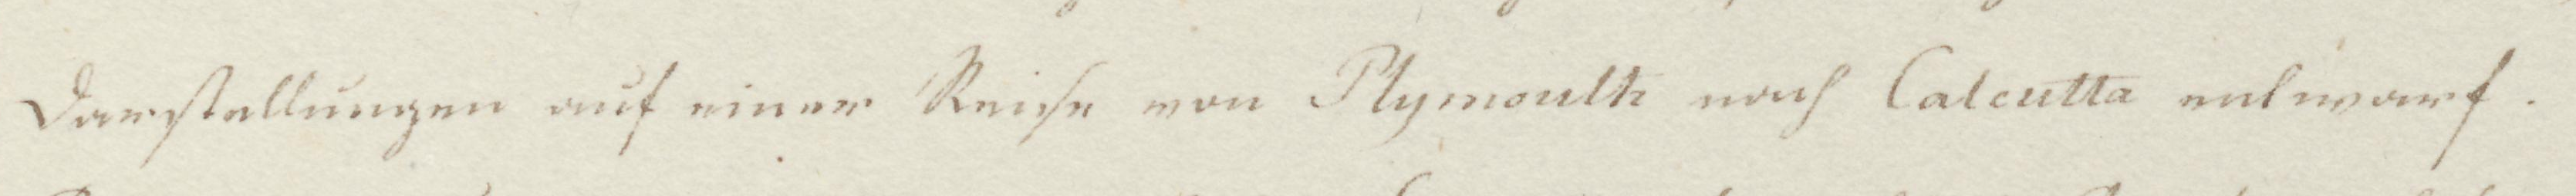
Darstellungen auf seiner Reise von Plymouth nach Calcutta entwarf.
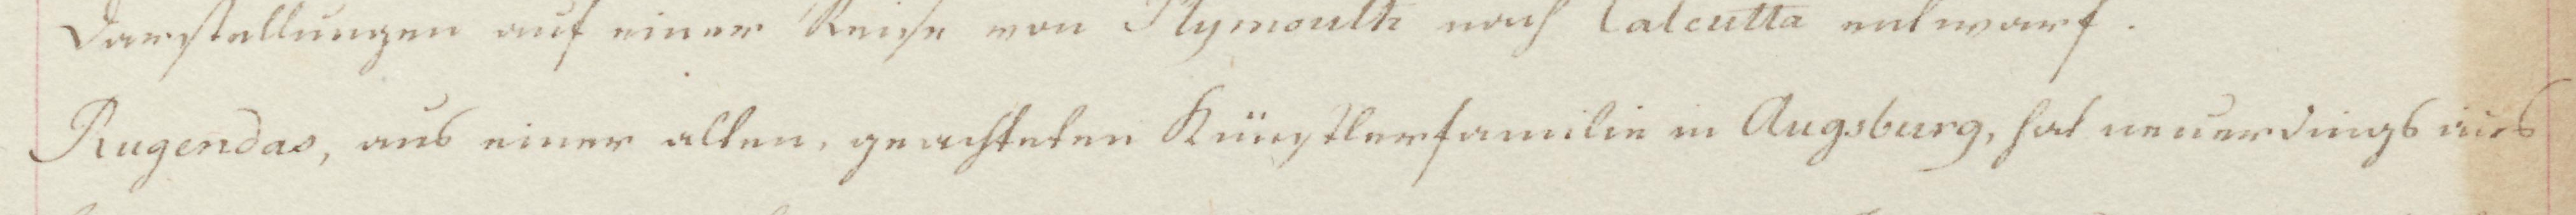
Rugendas, aus einer alten, geachteten Künstlerfamilie in Augsburg, hat neuerdings aus
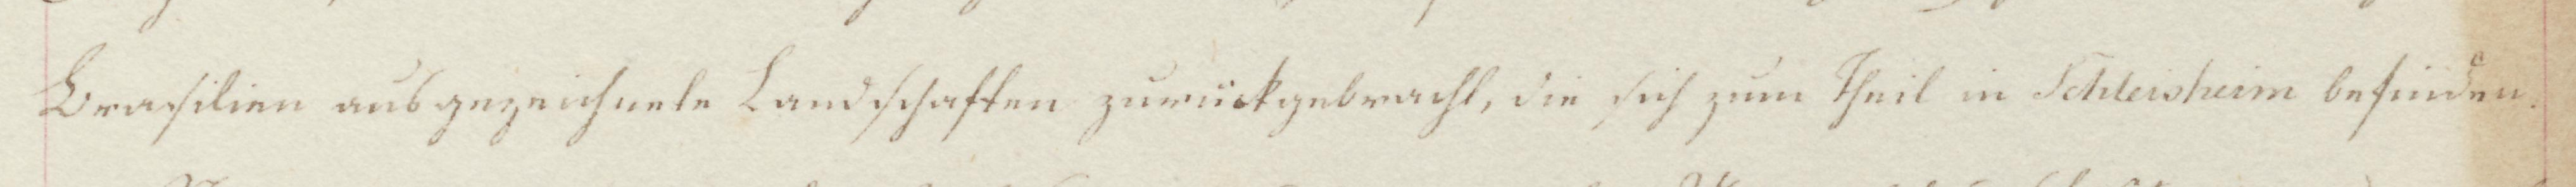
Brasilien ausgezeichnete Landschaften zurückgebracht, die sich zum Theil in Schleisheim befinden.
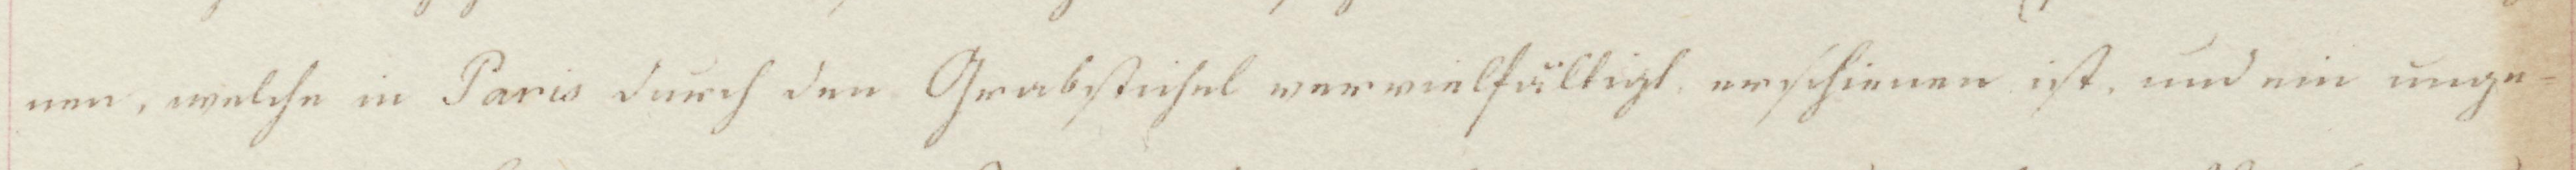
nen, welche in Paris durch den Grabstichel vervielfältigt, erschienen ist, und ein unge-
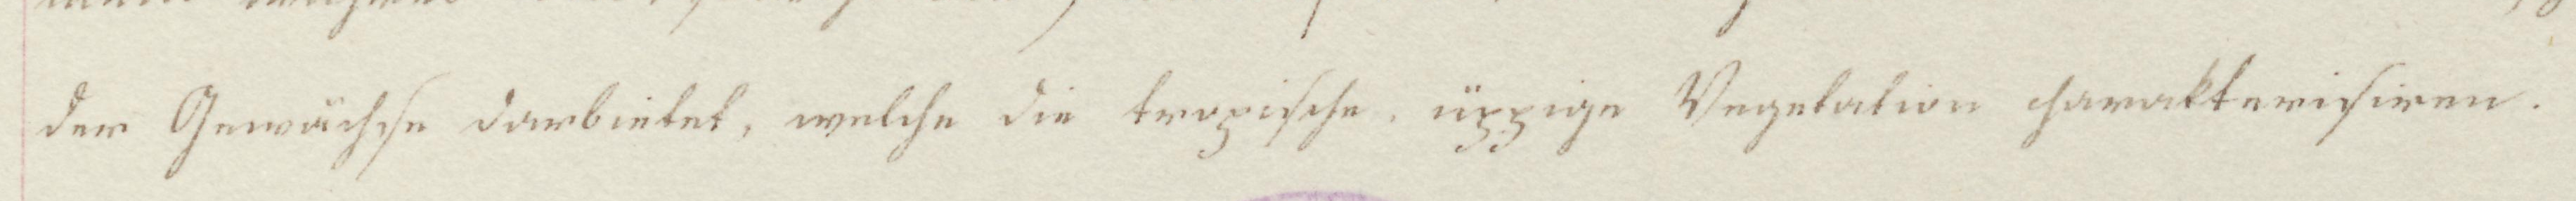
der Gewächse darbietet, welche die tropische üppige Vegetation charakterisiren.
